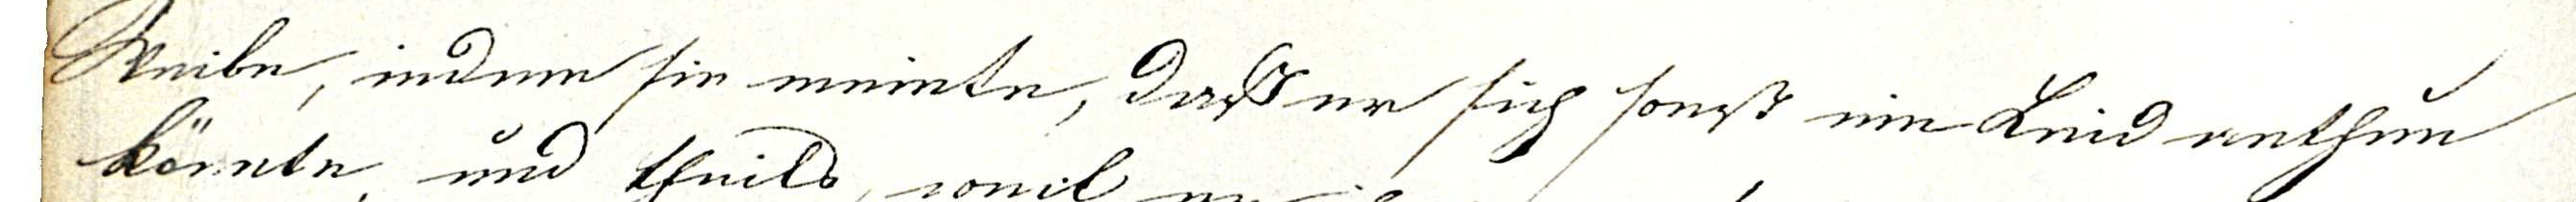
Weibe, in dem sie meinte, daß er sich sonst ein Lind anthun
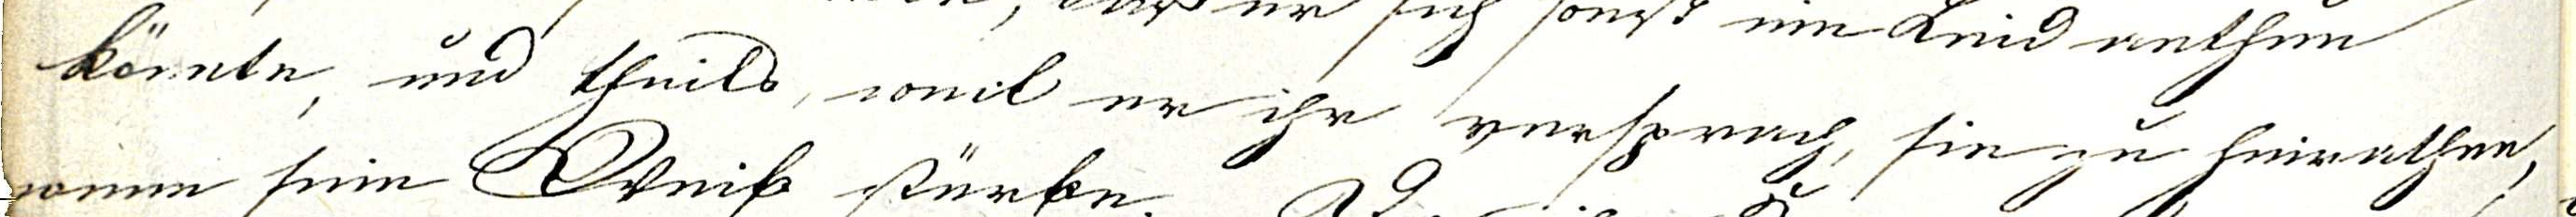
könnte, und theils, weil er ihre versprach, sie zu heirathen,
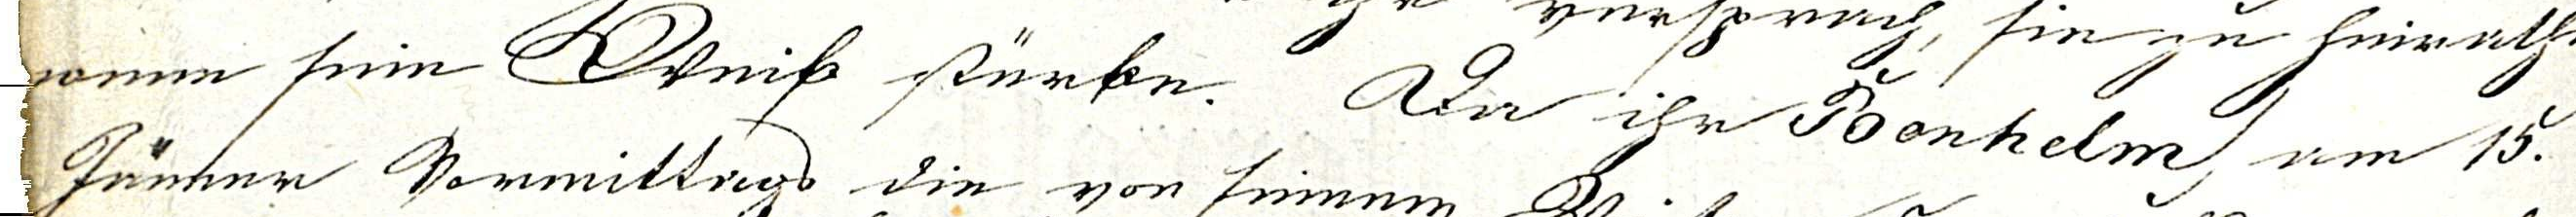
wenn sein Weib stürbe. Da ihr Bonhelm am 15.
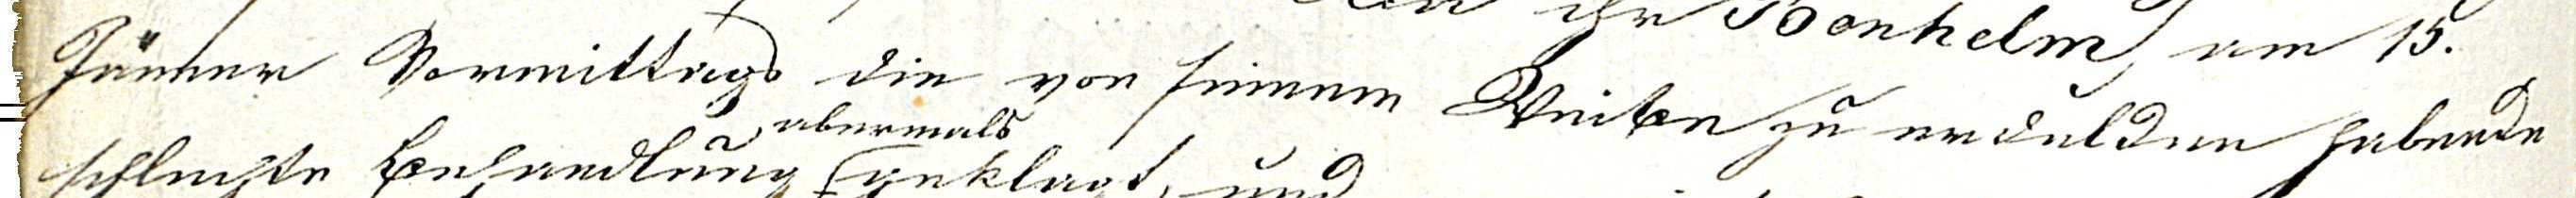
Jänner Vormittags die von seinem Weibe zu erdulden habende
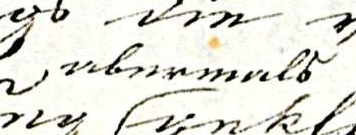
abermals
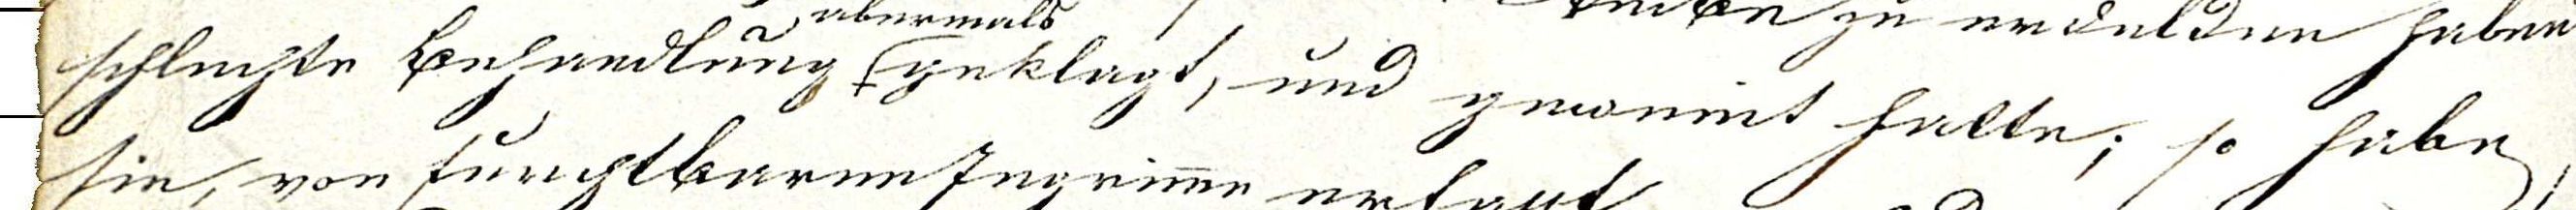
schlechte Behandlung geklagt, und geweint hatte; so habe
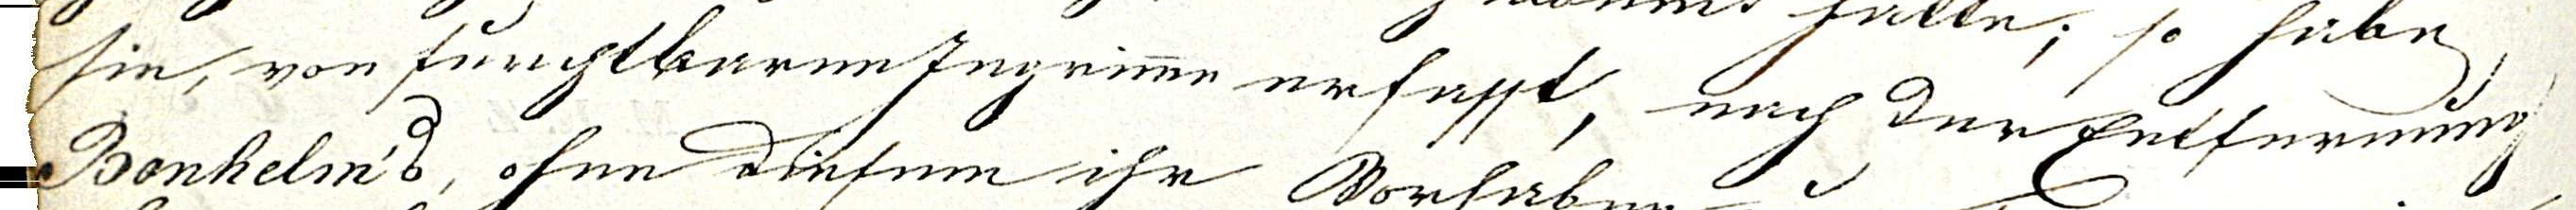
sie, von furchtbaren Jngrimme erfasst, nach der Entfernung
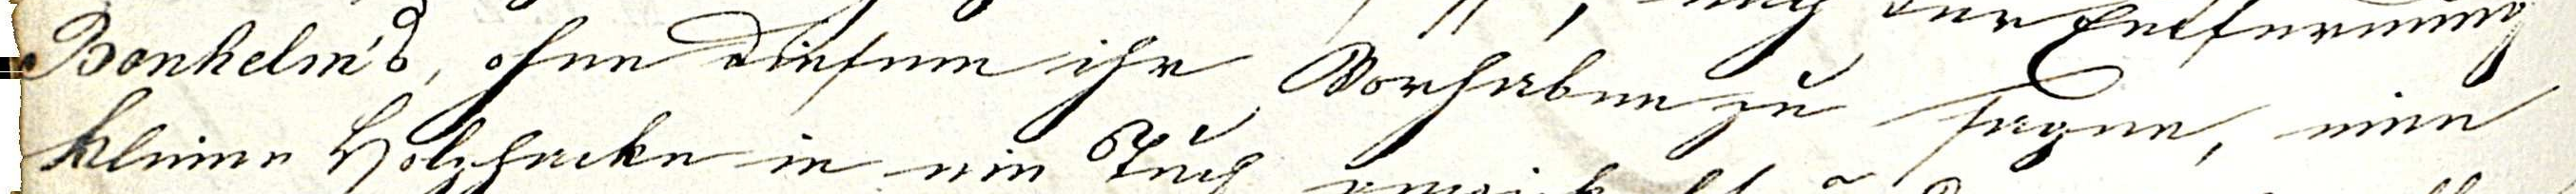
Bonhelm's, ohne diesem ihr Vorhaben zu sagen, eine
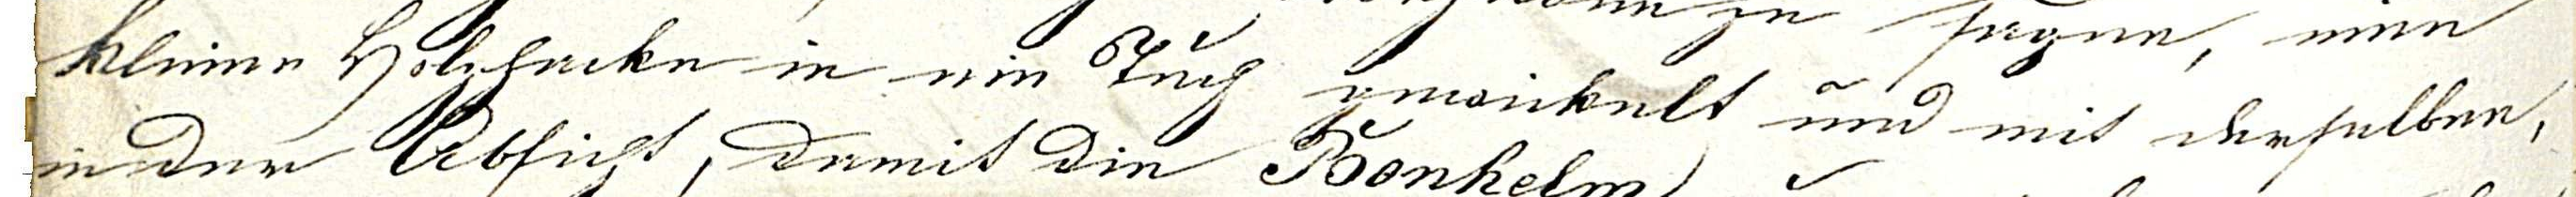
kleine Holzhacke in ein Tuch gewickelt und mit derselben,
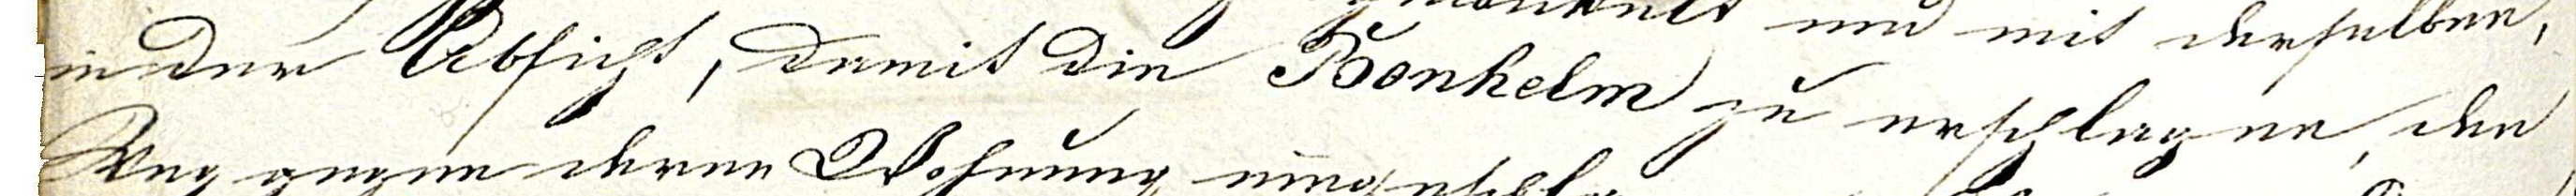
in der Absicht, damit die Bonhelm zu erschlagen, den
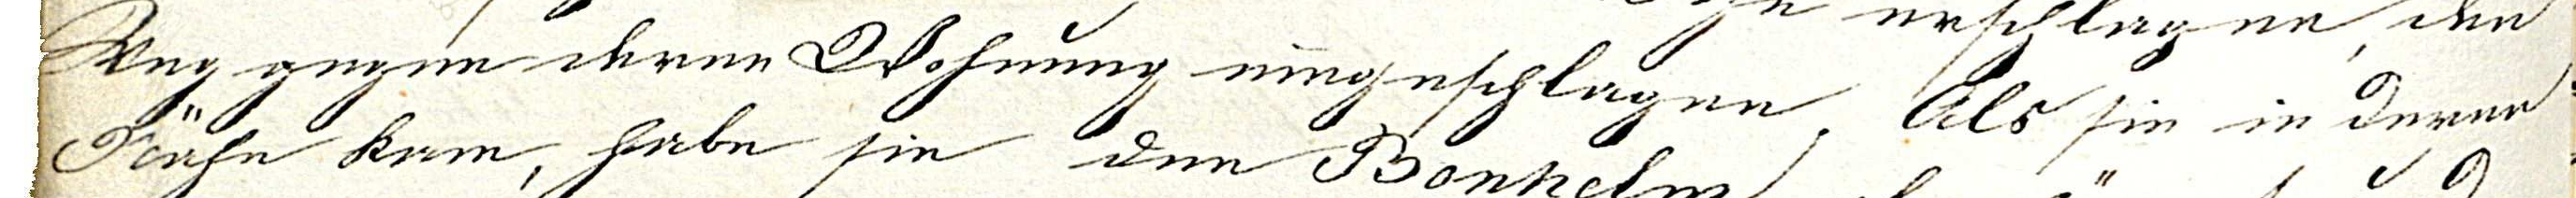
Weg gegen deren Wohnung eingeschlagen. Als sie in deren
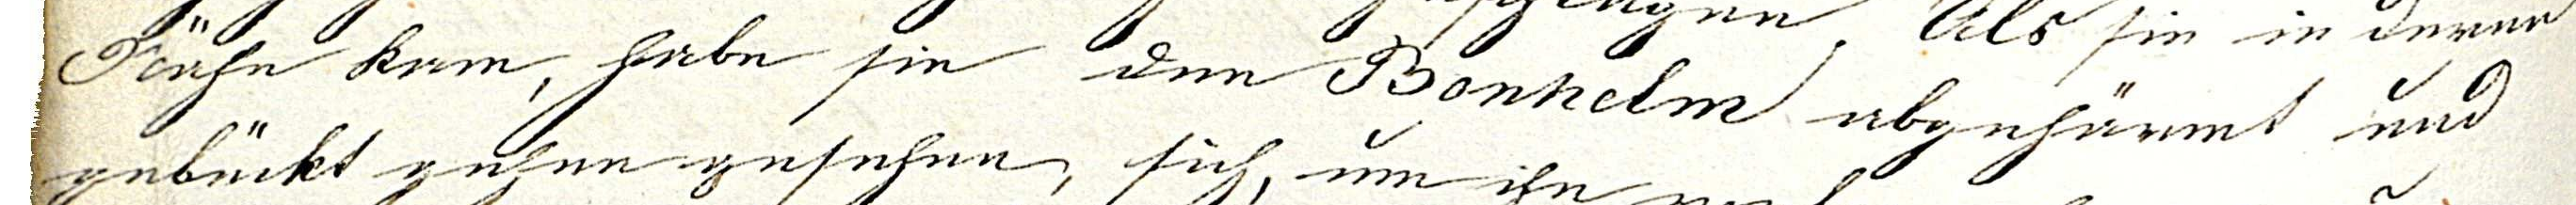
Nähe kam, habe sie dem Bonhelm abgehärmt und
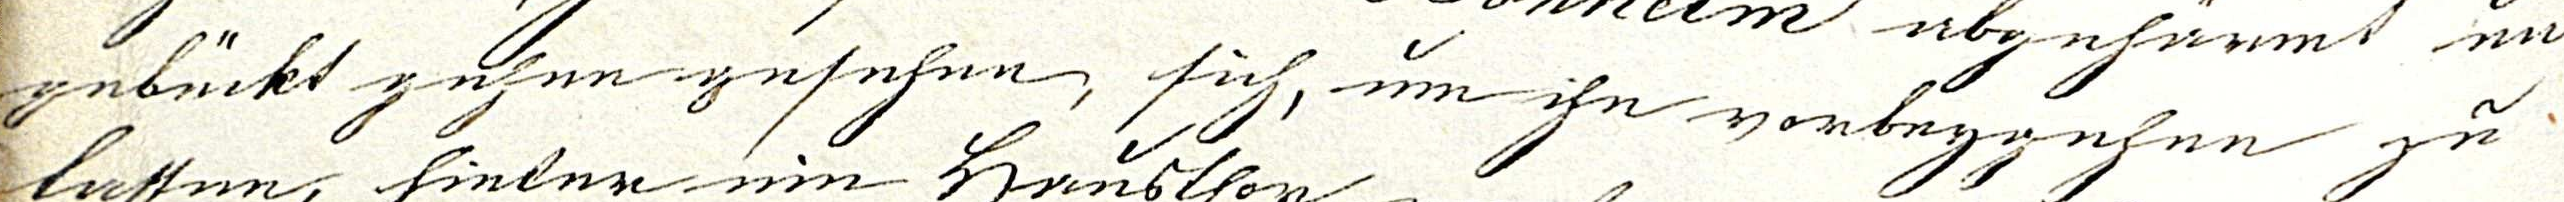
gebückt gehen gesehen, sich, um ihn vorbeygehen zu
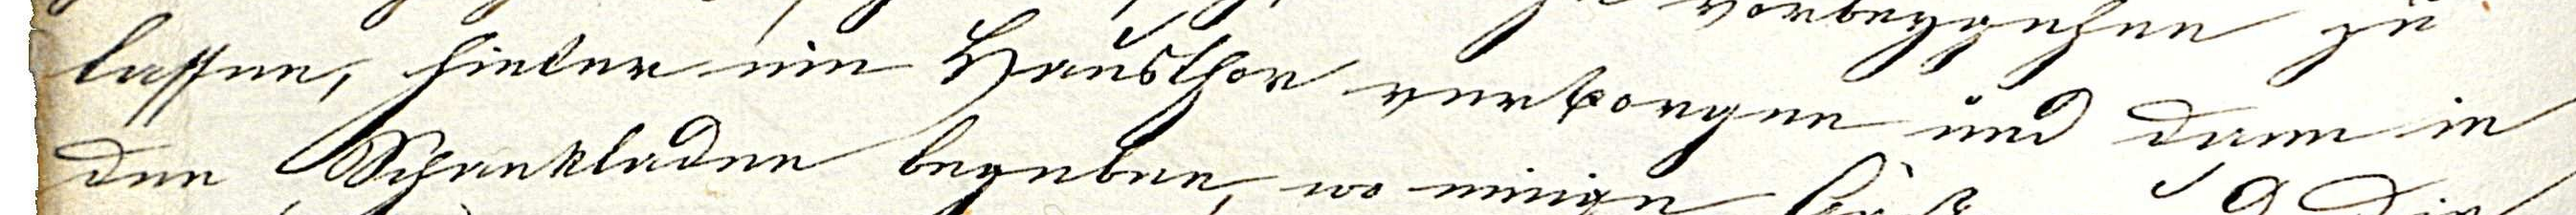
lassenn, hinter ein Hausthor verborgen und dann in
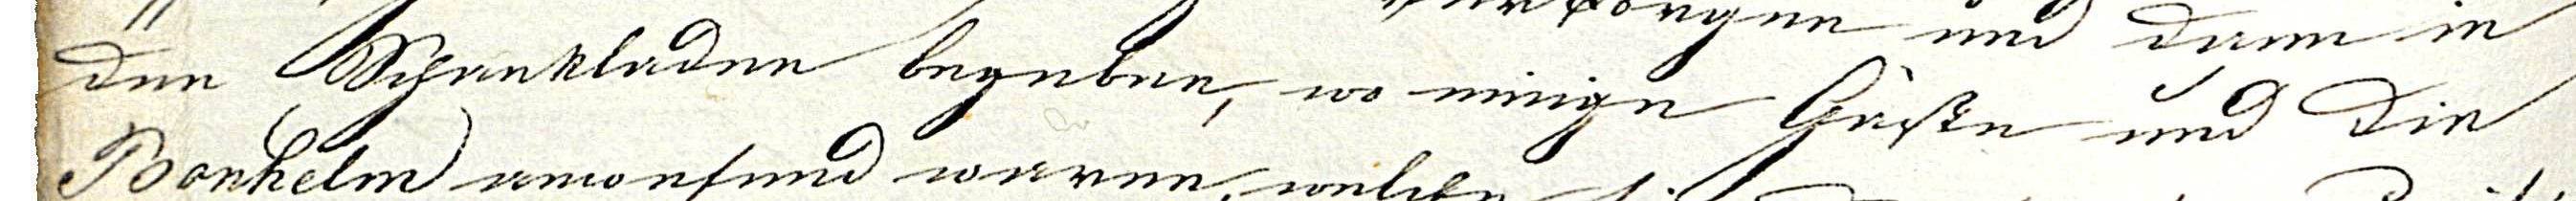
den Schankladen begeben, wo einige Gäste und die
